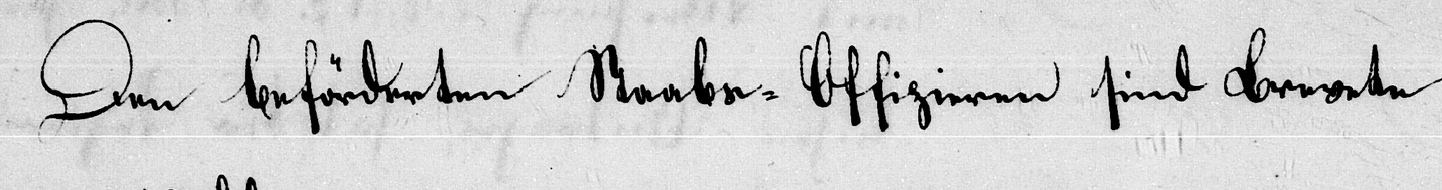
Den beförderten Staabs-Offizieren sind Brevete
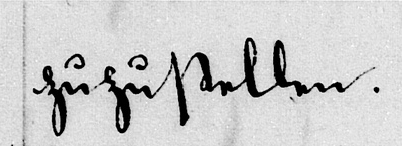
zuzustellen.
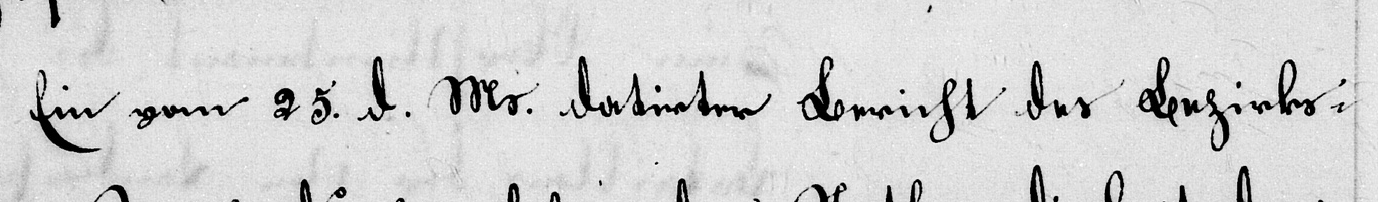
Ein vom 25. d. Ms. [sic!] datirter Bericht des Bezirks¬
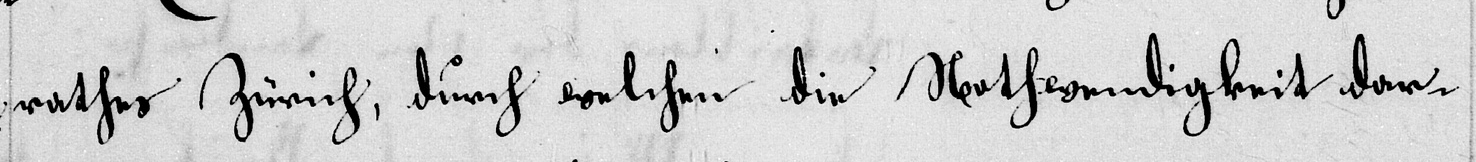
rathes Zürich, durch welchen die Nothwendigkeit dar¬
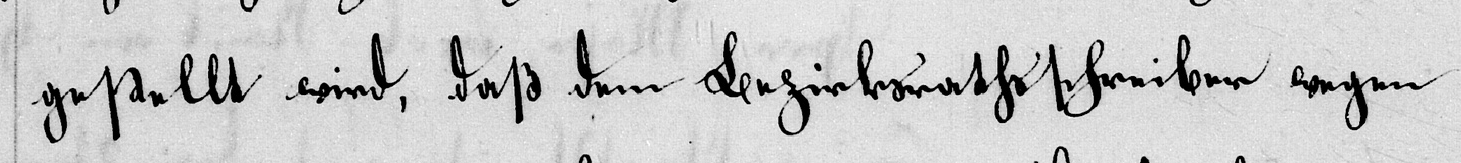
gestellt wird, daß dem Bezirksrathsschreiber wegen
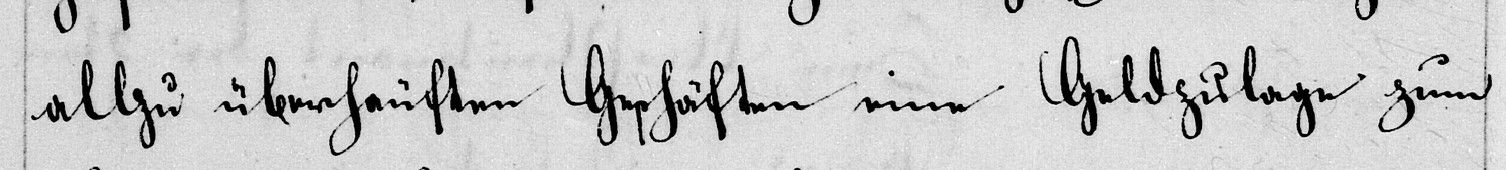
allzu überhäuften Geschäften eine Geldzulage zum
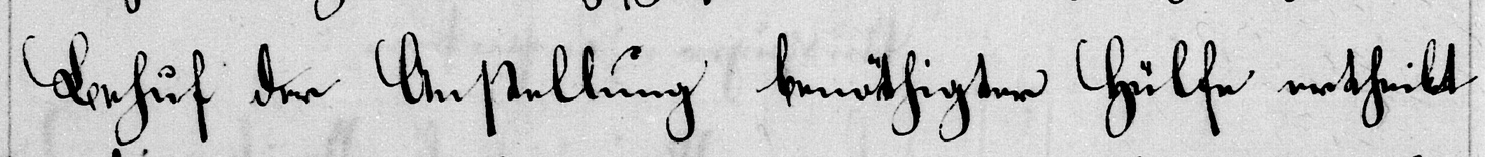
Behuf der Anstellung benöthigter Hülfe ertheilt
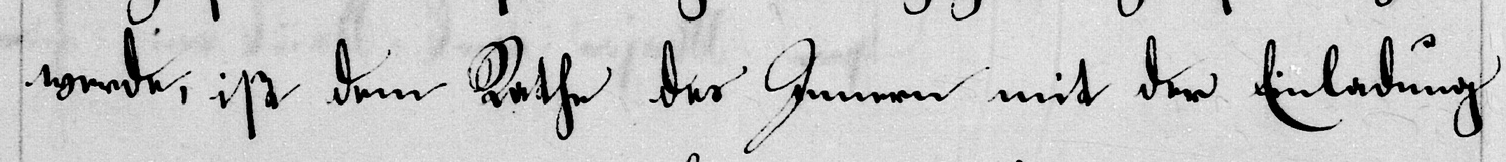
werde, ist dem Rathe des Innern mit der Einladung
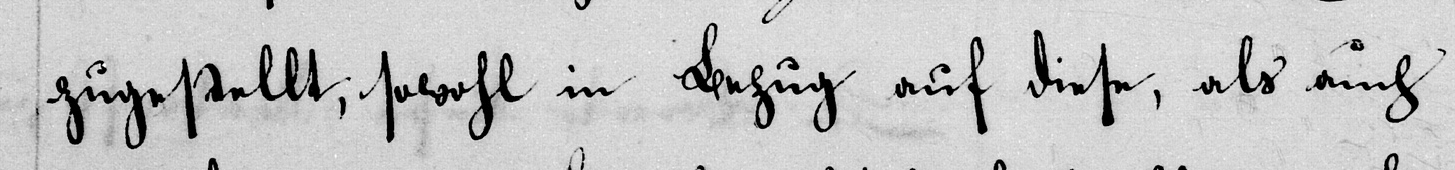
zugestellt, sowohl in Bezug auf diese, als auch
